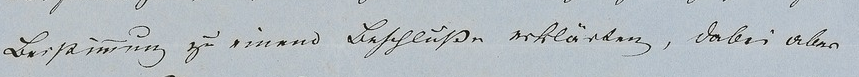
Beistimmung zu einem Beschluße erklärten, dabei aber
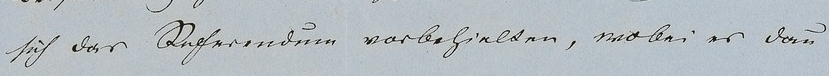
sich das Referendum vorbehielten, wobei es dann
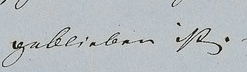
geblieben ist. –
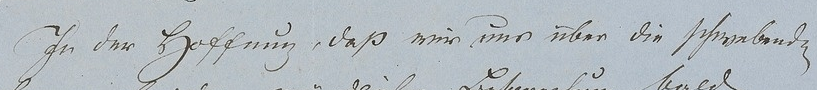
In der Hoffnung, daß wir uns über die schwebenden
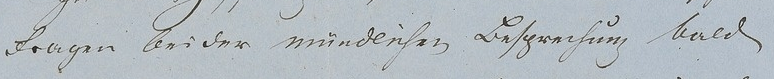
Fragen bei der mündlichen Besprechung bald
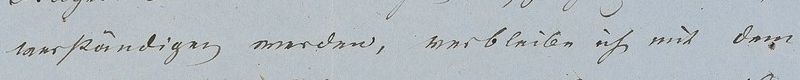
verständigen werden, verbleibe ich mit dem
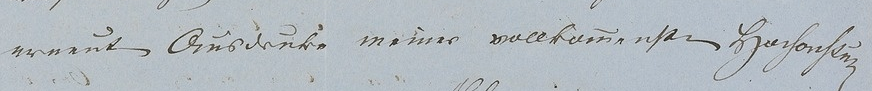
erneuten Ausdruke meiner vollkommensten Hochachtung
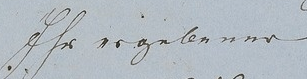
Ihr ergebener
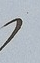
J.
